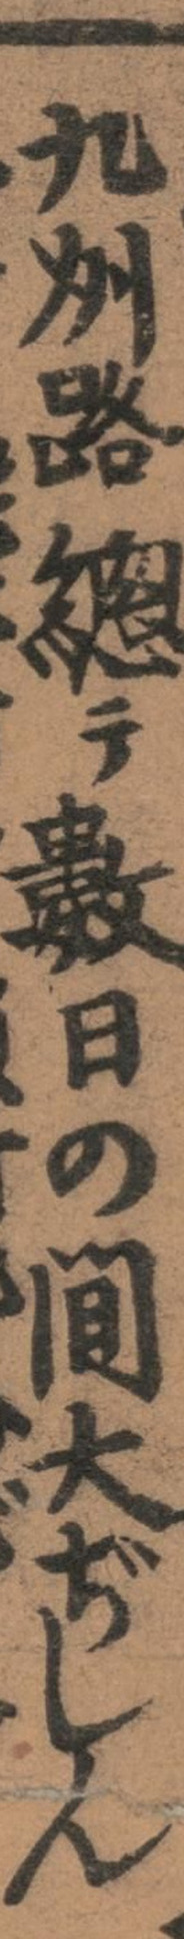九州路総て数日の間大ぢしん
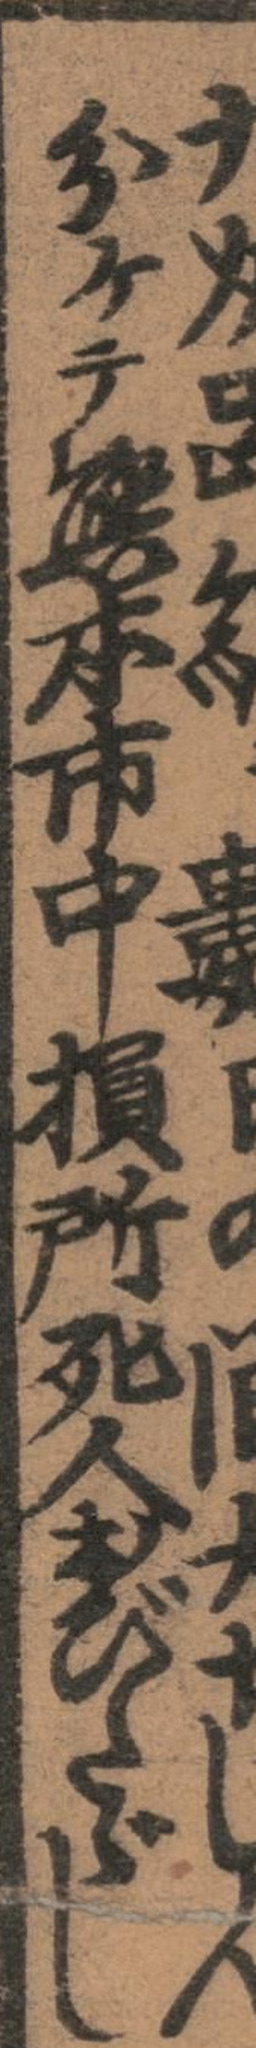分けて熊本市中損所死人おびたゞし
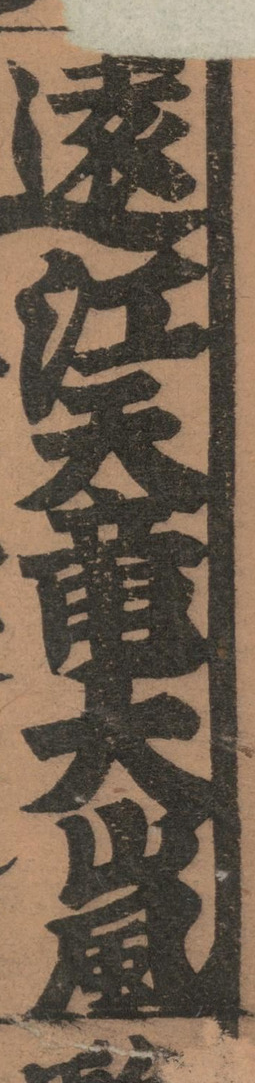遠江天竜大嵐
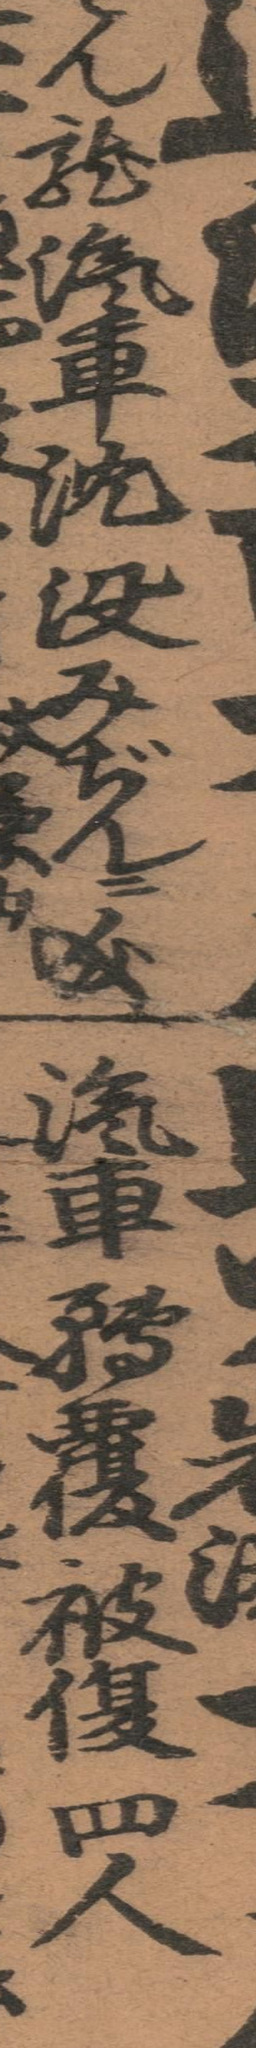てん龍汽車沈没みぢんに成
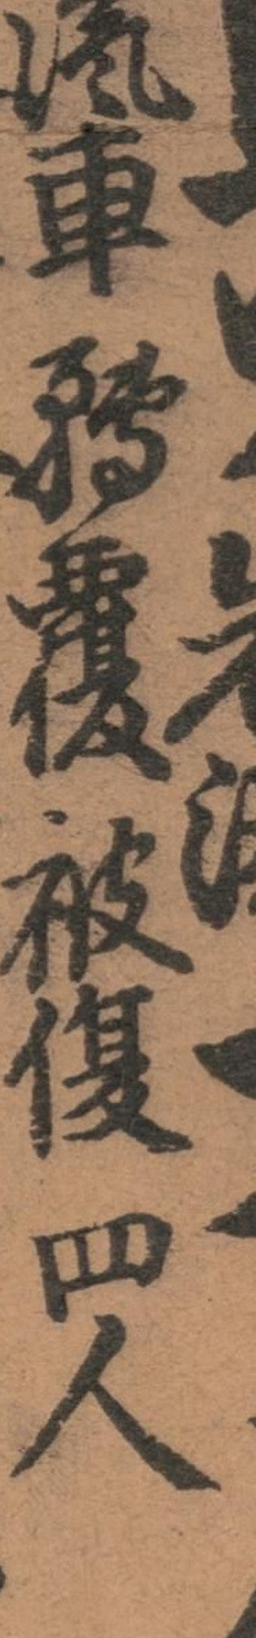汽車転覆被傷四人
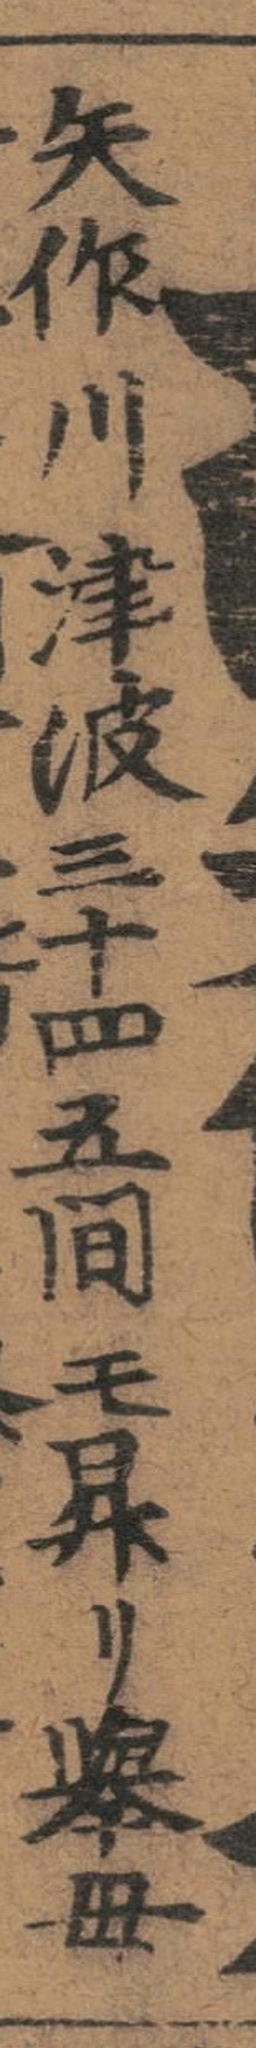矢作川津波三十四五間も昇り挙母
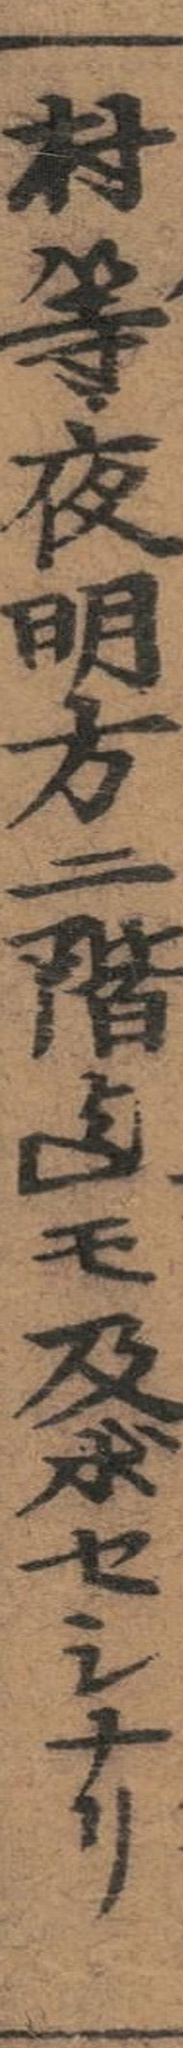村等夜明方二階迄も及ぼセシナリ
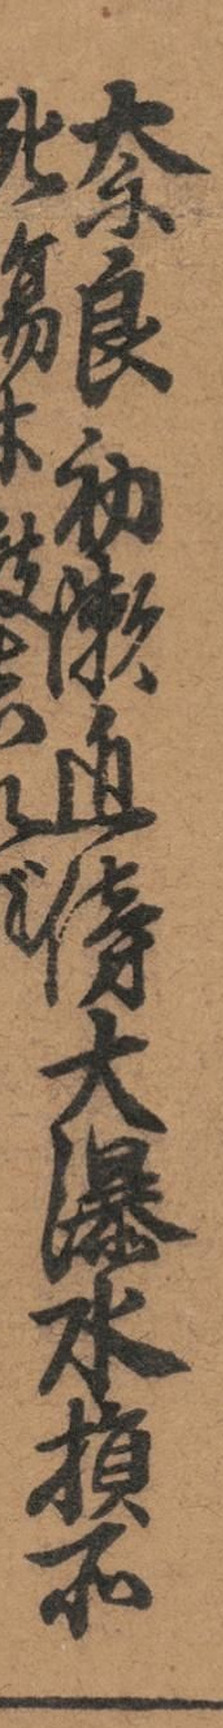奈良初瀬近傍大瀑水損所
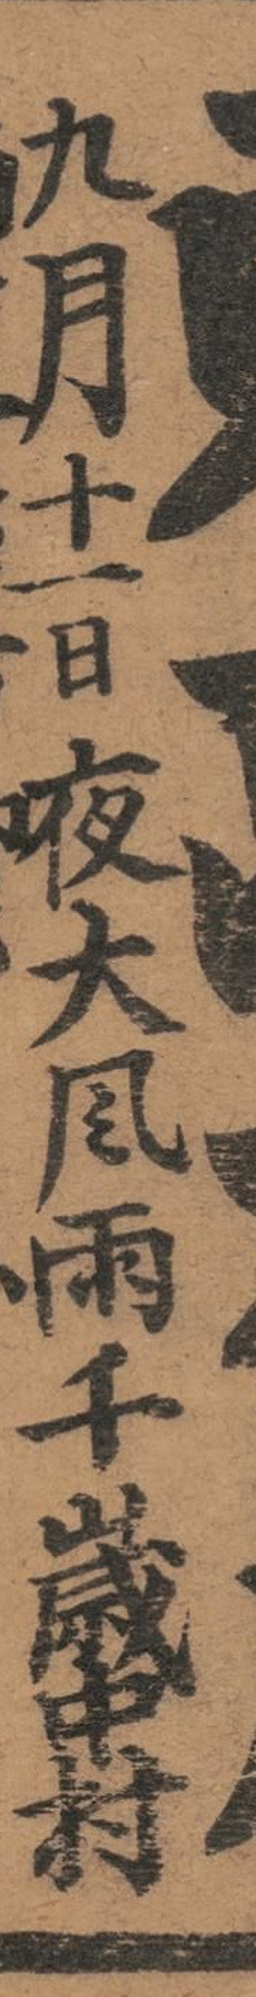九月十一日夜大風雨千歳中村
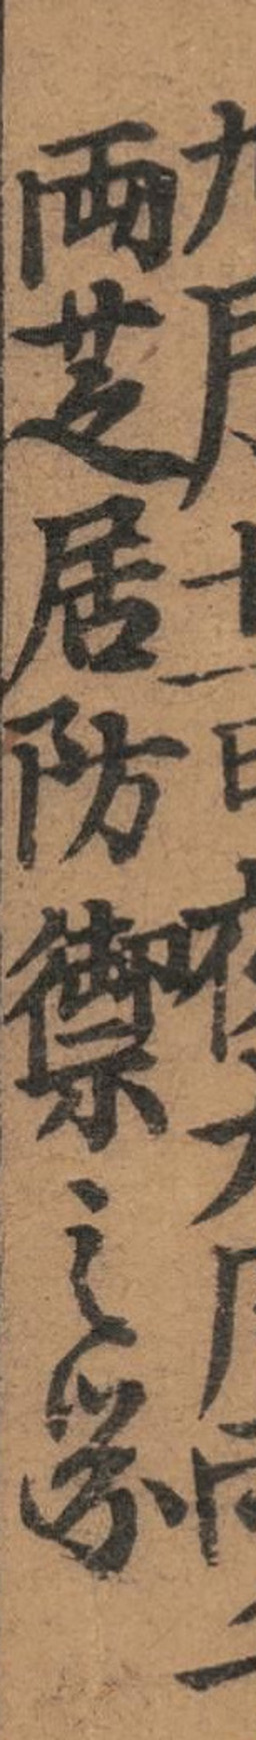兩芝居防禦之図
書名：明治廿二年國々天災圖画
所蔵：東京大学地震研究所図書室 Earthquake Research Institute Library, The University of Tokyo, JAPAN
